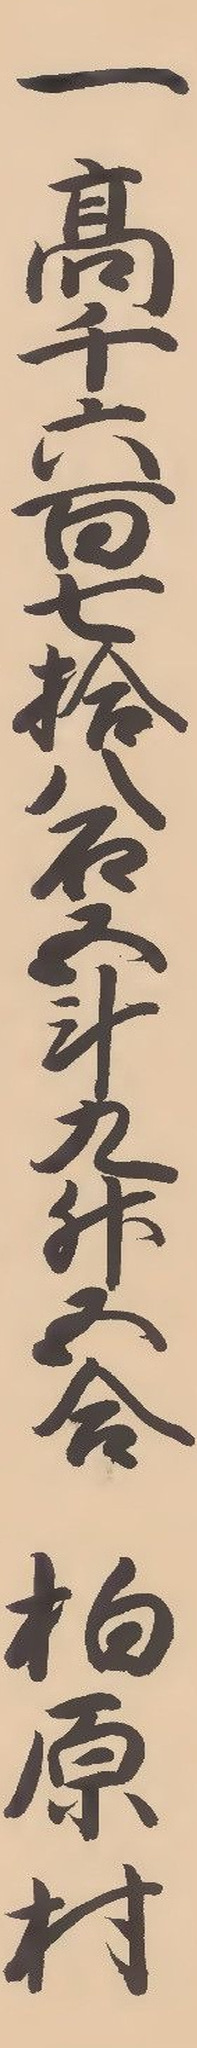一高千六百七拾八石五斗九升五合柏原村
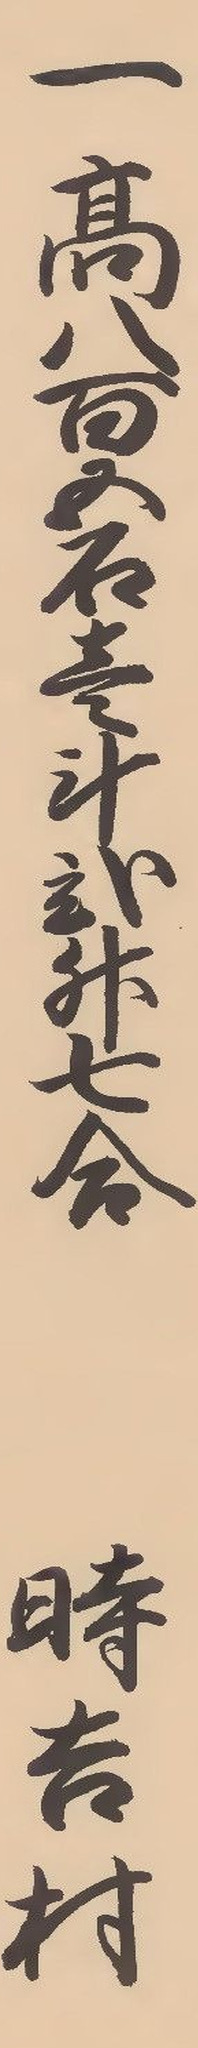一高八百五石壱斗弐升七合時吉村
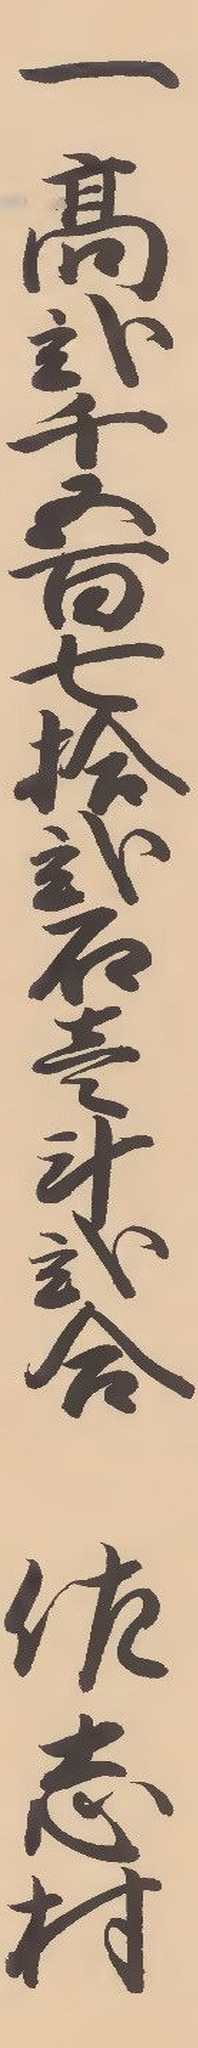一高弐千五百七拾弐石壱斗弐合佐志村
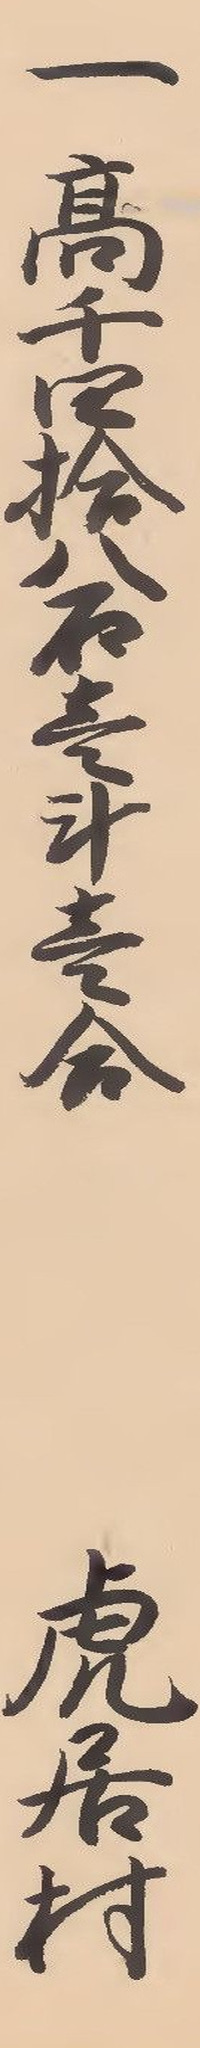一高千四拾八石壱斗壱合虎居村
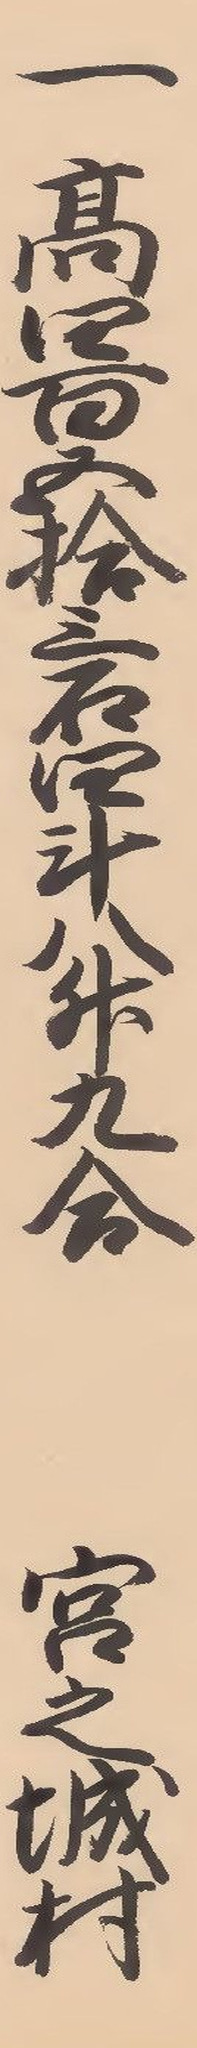一高四百五拾三石四斗八升九合宮之城村
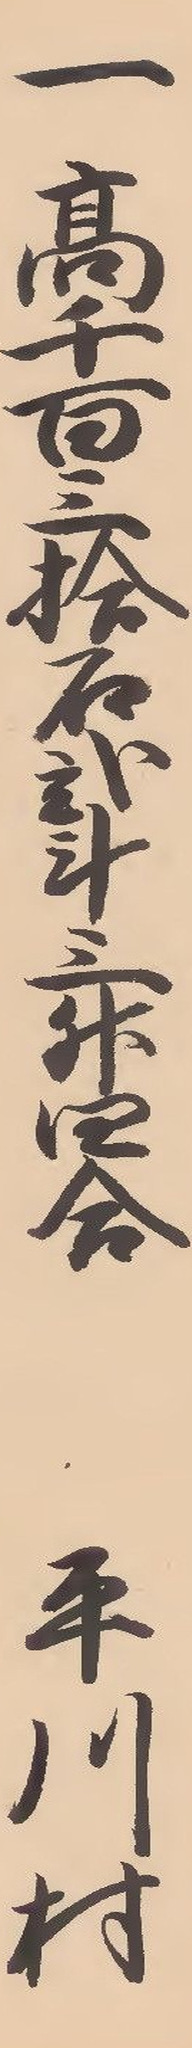一高千百三拾石弐斗三升四合平川村
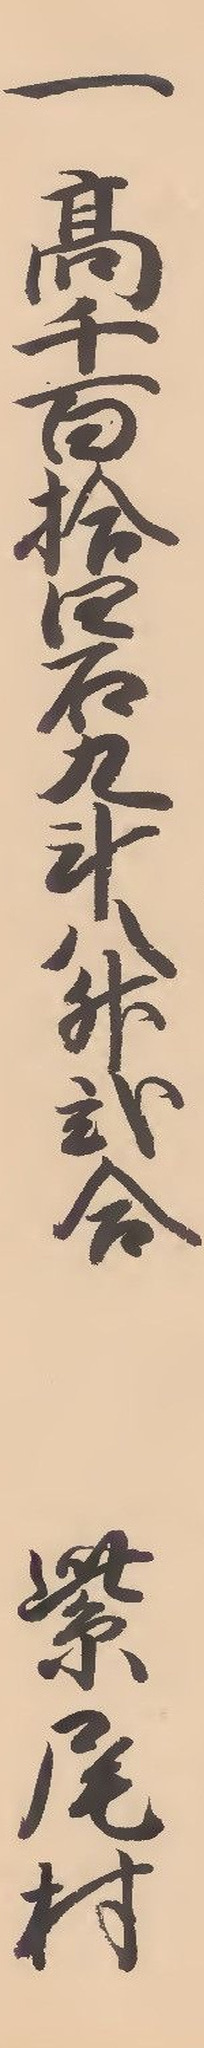一高千百拾四石九斗八升弐合紫尾村

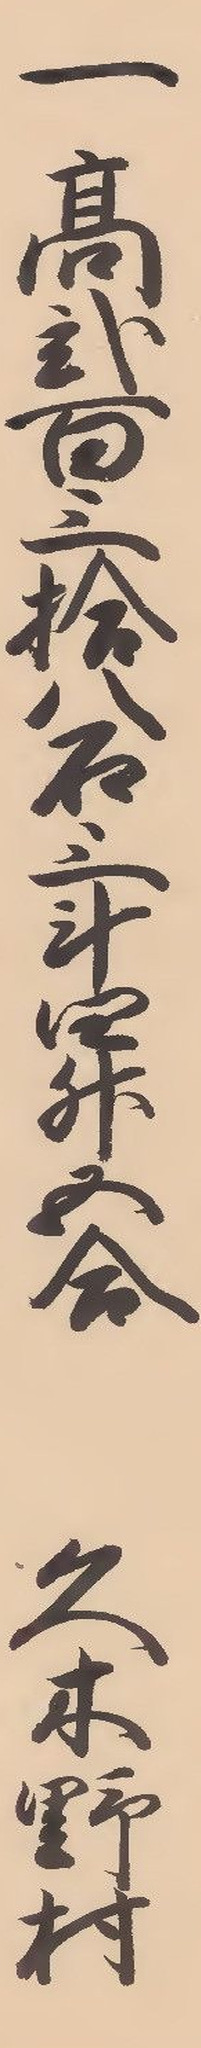一高弐百三拾八石三斗四升五合久木野村
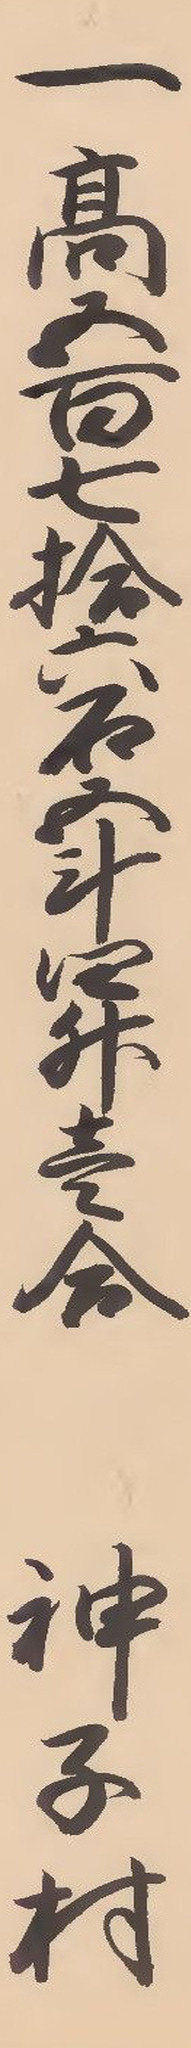一高五百七拾六石五斗四升壱合神子村
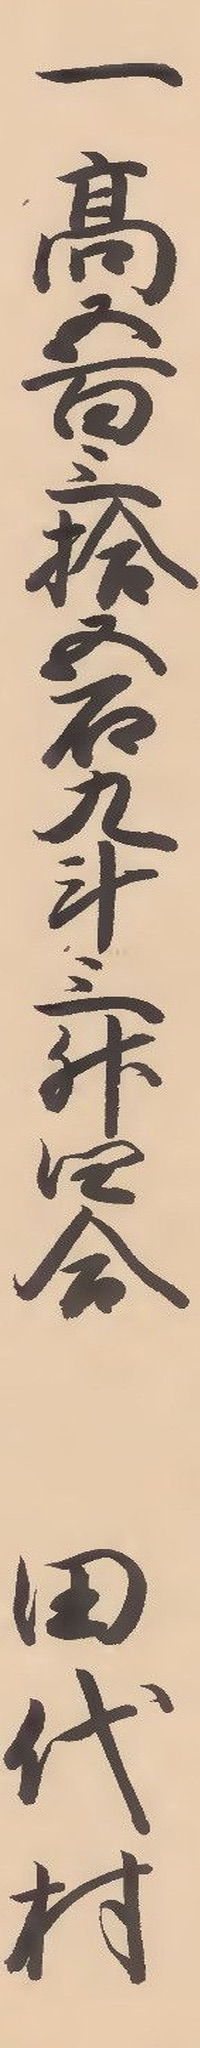一高五百三拾五石九斗三升四合田代村
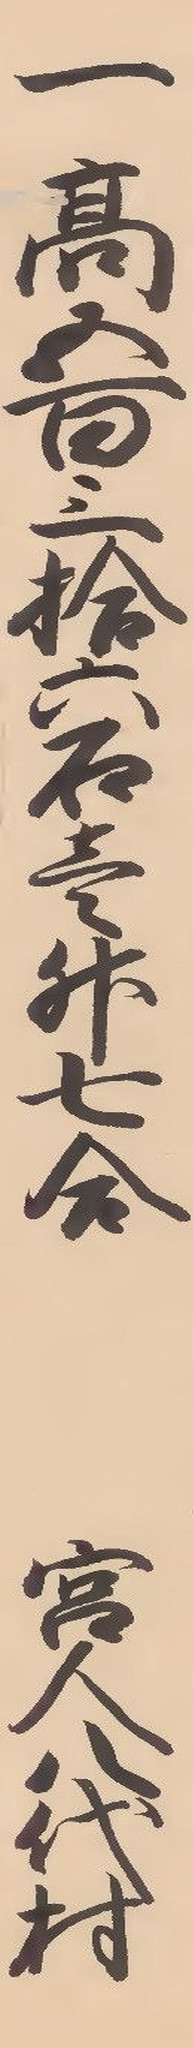一高五百三拾六石壱升七合宮人八代村
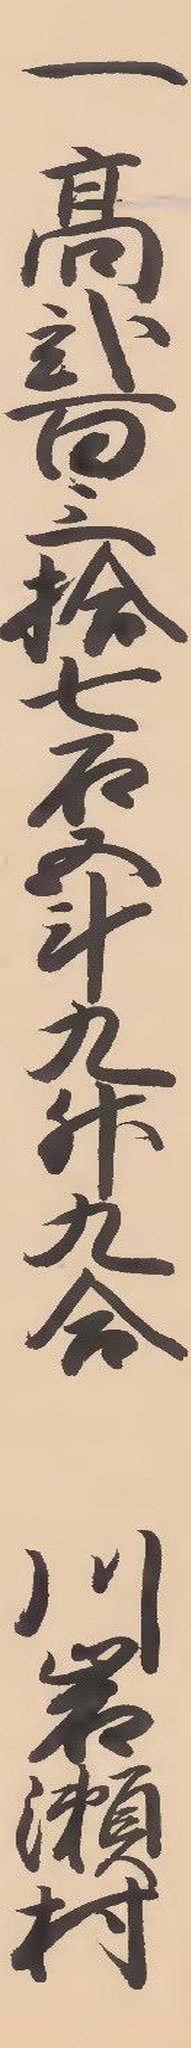一高弐百三拾七石五斗九升九合川岩瀬村
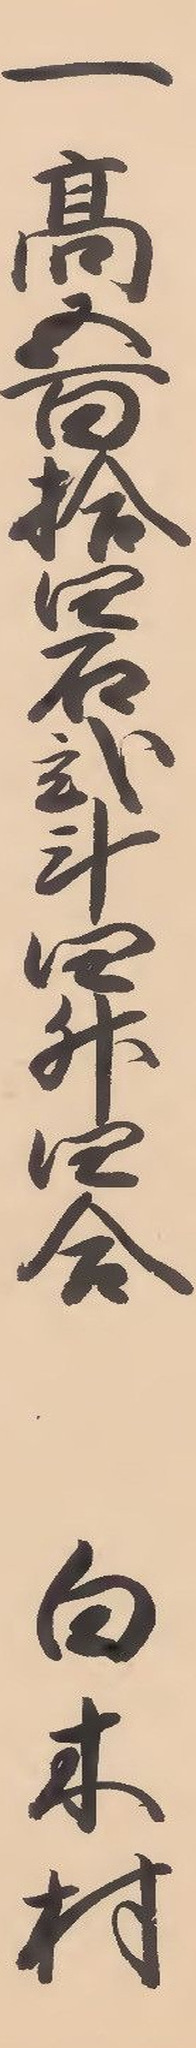一高五百拾四石弐斗四升四合白木村
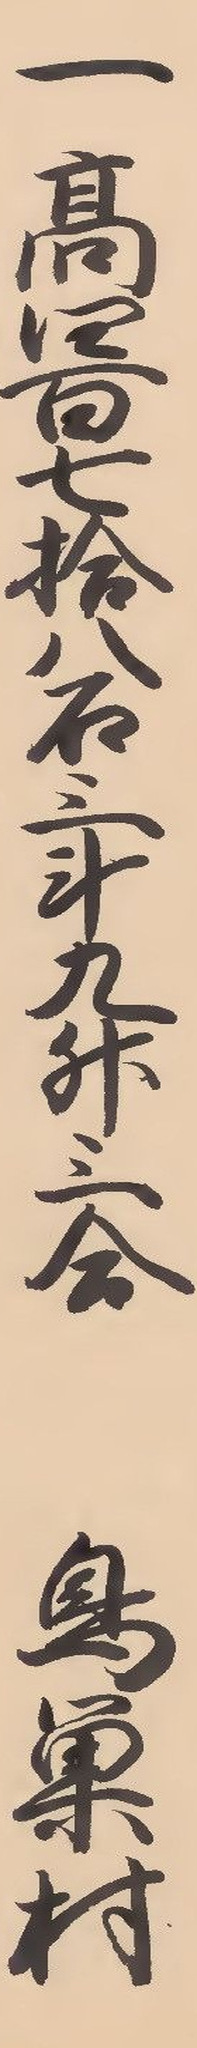一高四百七拾八石三斗九升三合鳥巣村
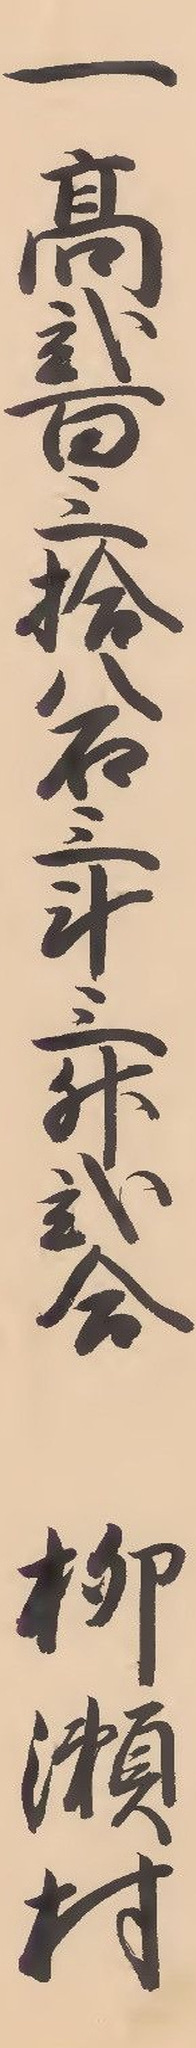一高弐百三拾八石三斗三升弐合柳瀬村

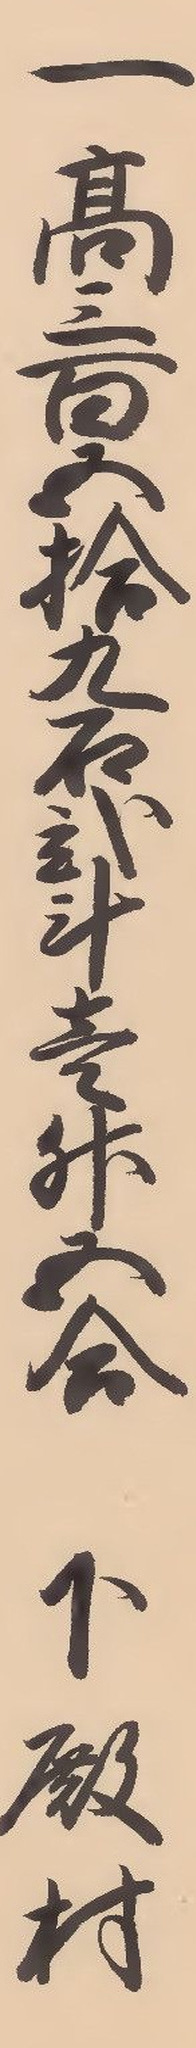一高三百五拾九石弐斗壱升五合下殿村
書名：薩摩国郷帳
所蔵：国立公文書館 National Archives of Japan
